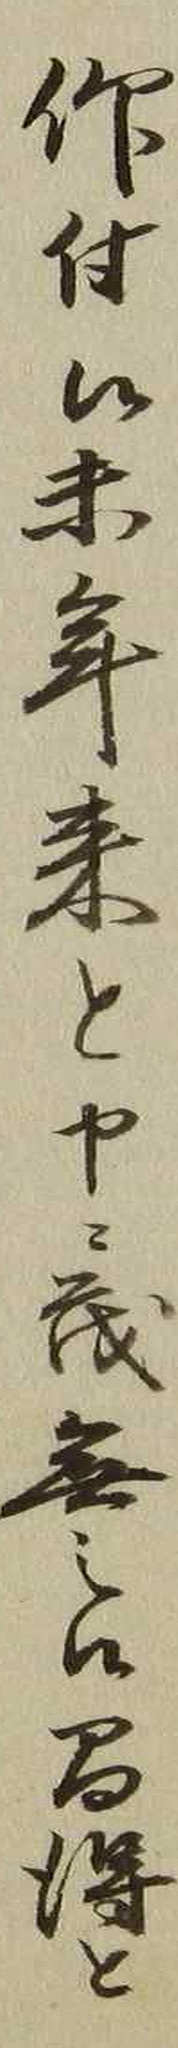仰付候未年来と申にも無之候間得と
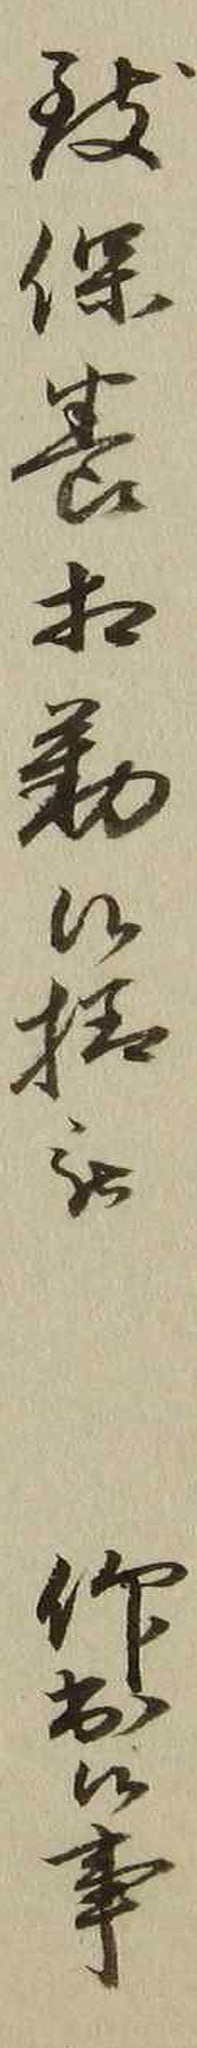致保養相勤候様被仰出候事
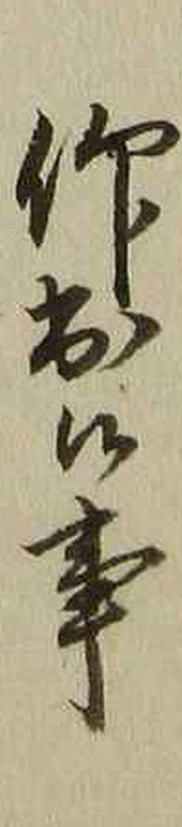仰出候事
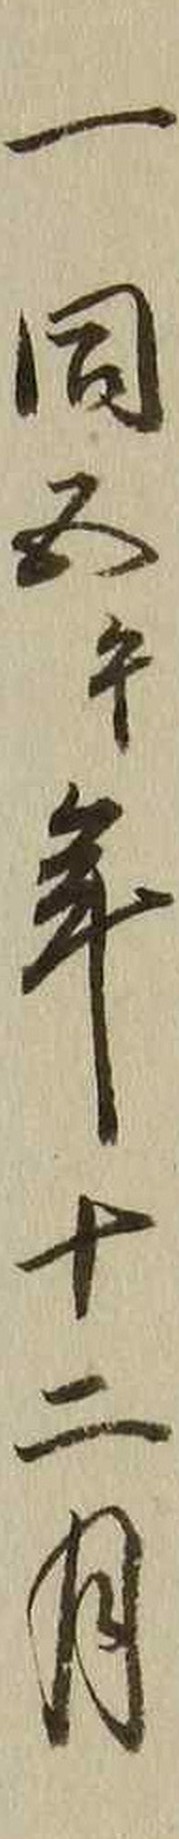一同五午年十二月
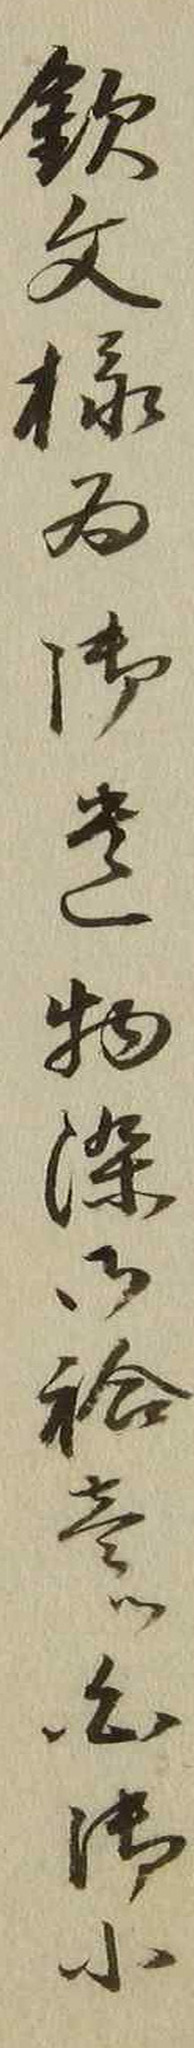欽文様為御遺物染御袷壱つ白御小
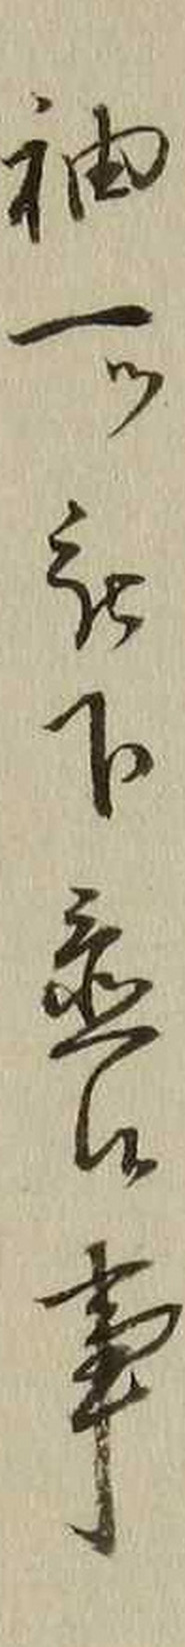袖一つ被下置候事
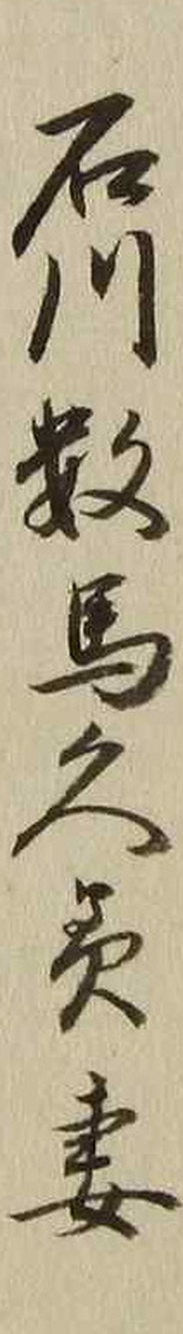女石川数馬久美妻
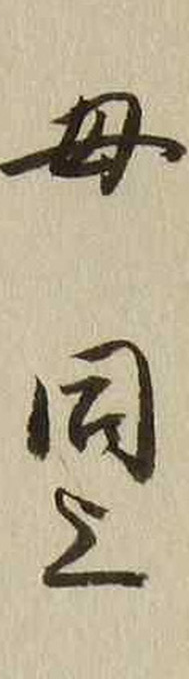母同上
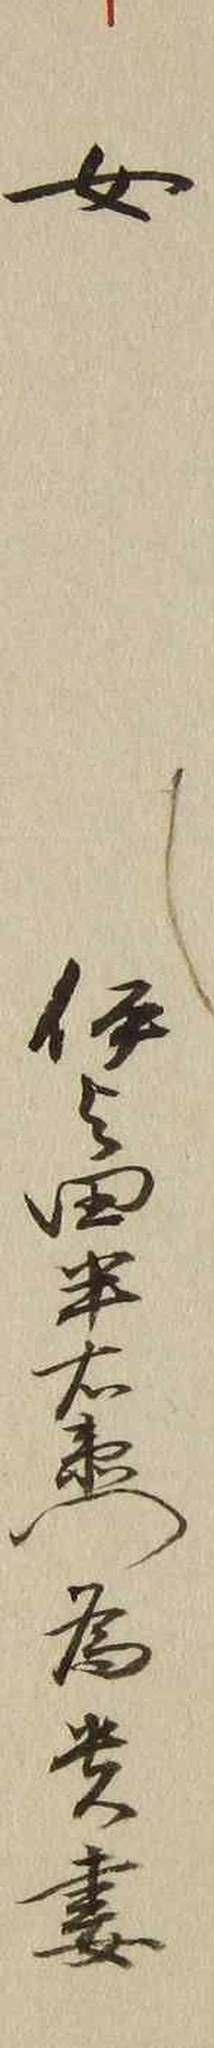女伊与田半右衛門為貴妻
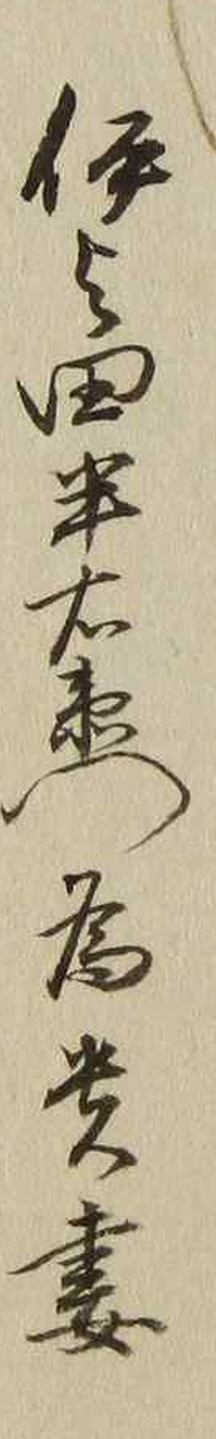女伊与田半右衛門為貴妻
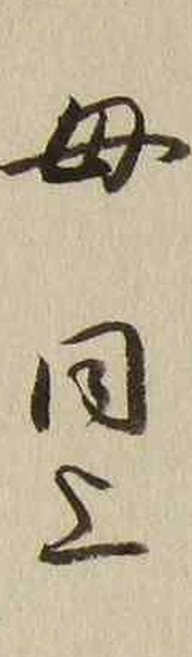母同上

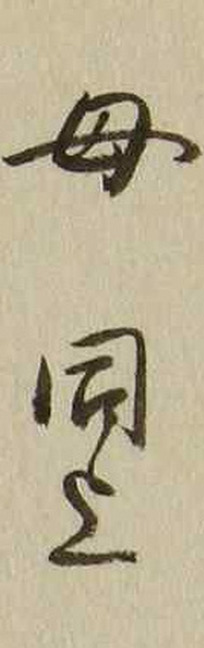母同上
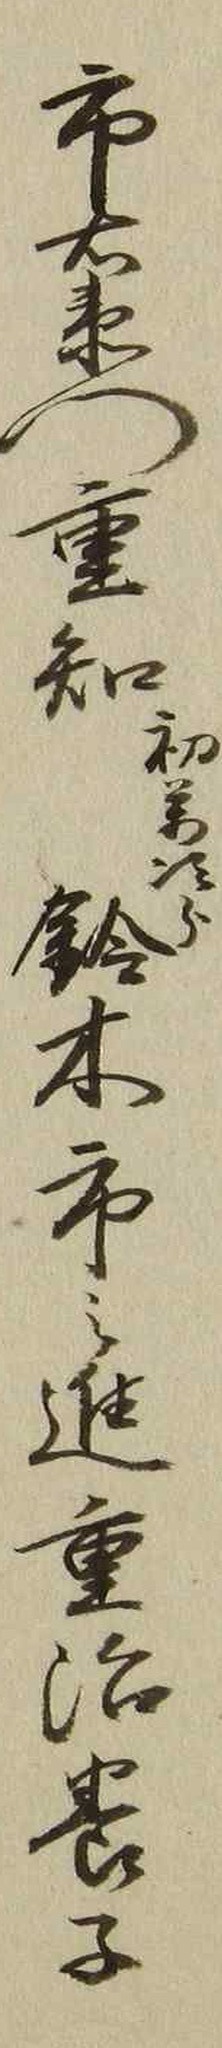市右衛門重知鈴木市之進重治養子
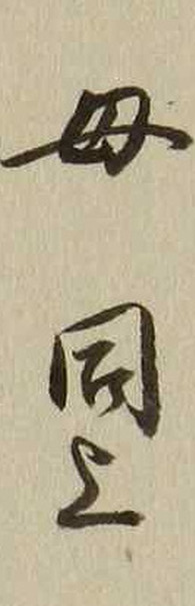母同上
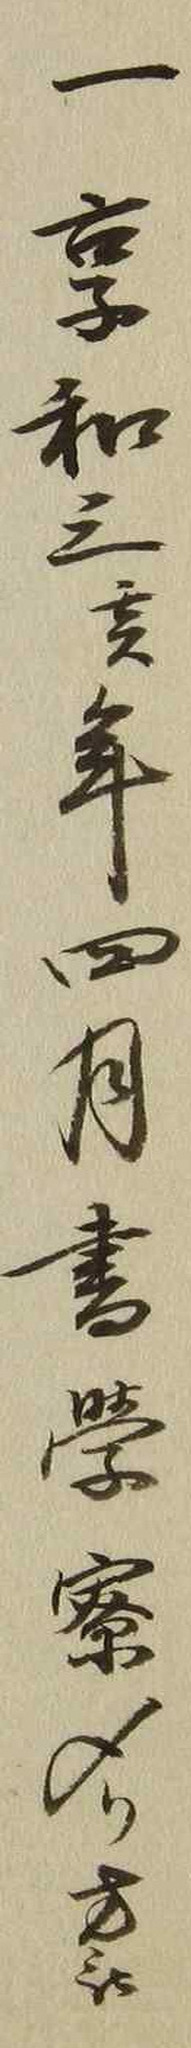一享和三亥年四月書学寮〆り方被
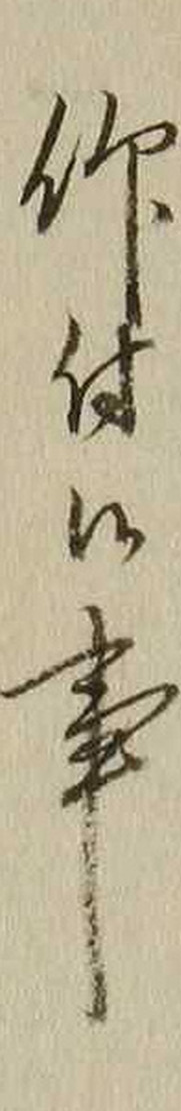仰付候事
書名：諸士系譜　巻之133　た之部9
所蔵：会津若松市立会津図書館
